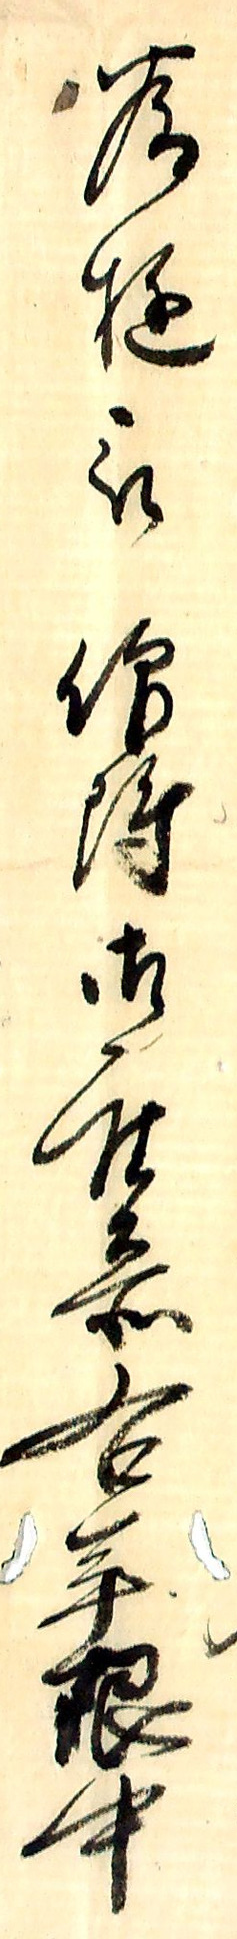為遊被仰附御座候所右年限中
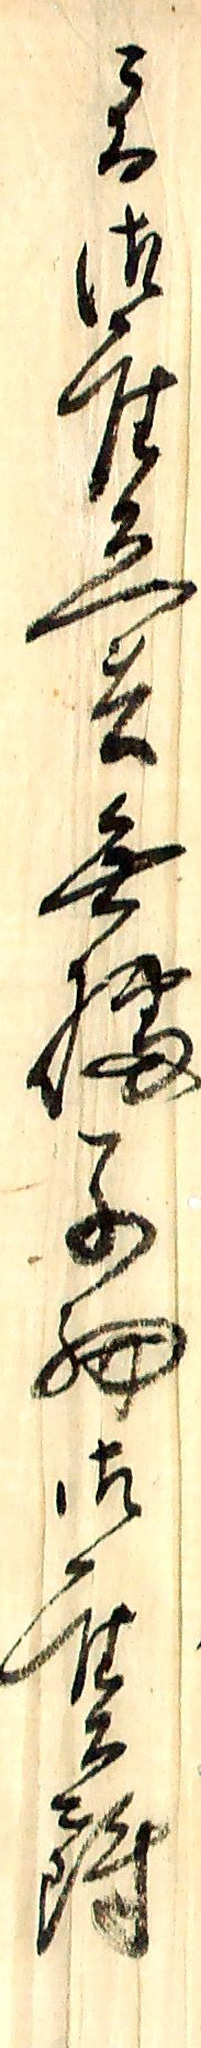にて御座候へ共無拠子細御座候附
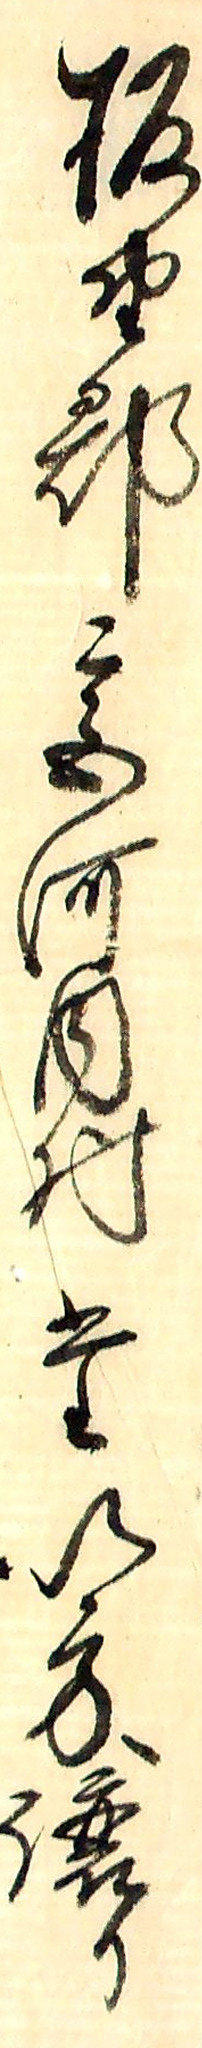板野郡宮河内村堂以方へ譲り
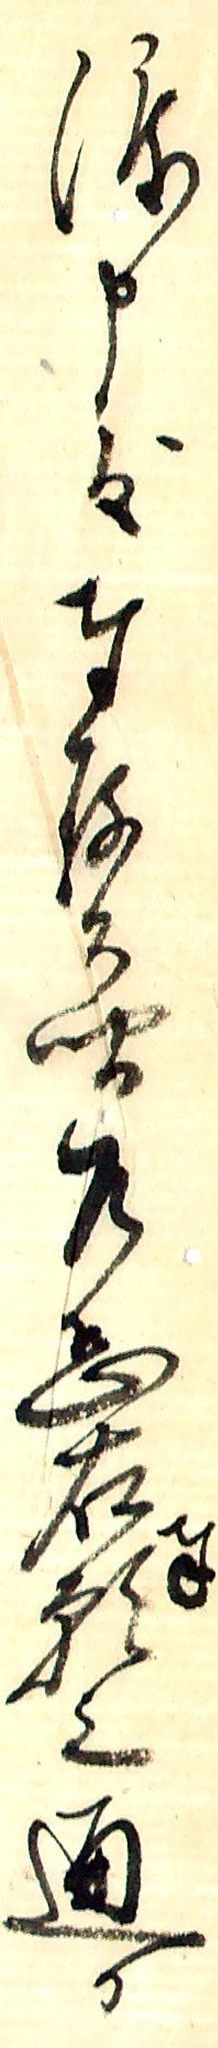渡申度奉存候間乍恐右奉願上通り

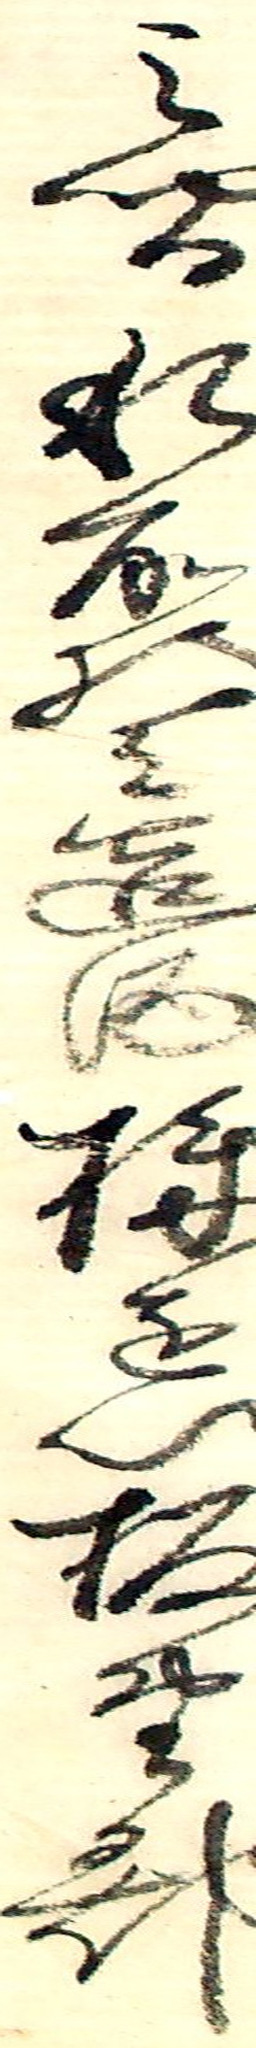之間私所持之造酒株を以板野郡
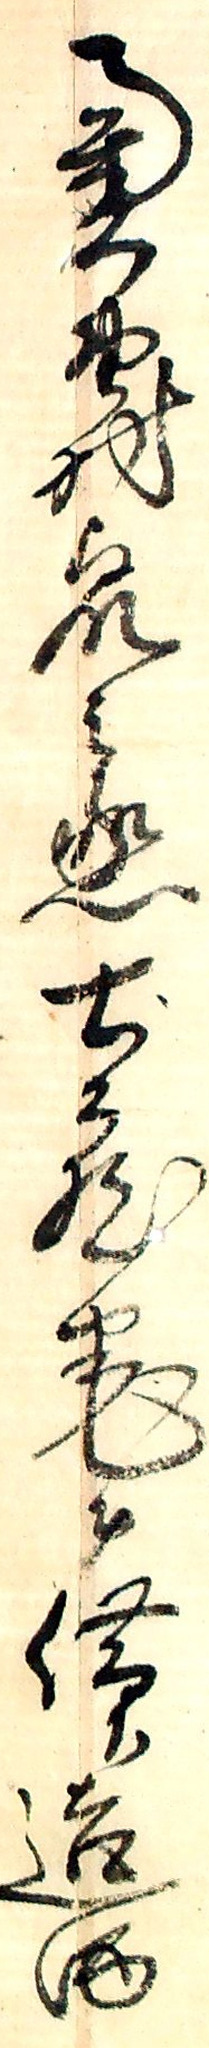奥野村虎之丞土蔵宅を借り造酒
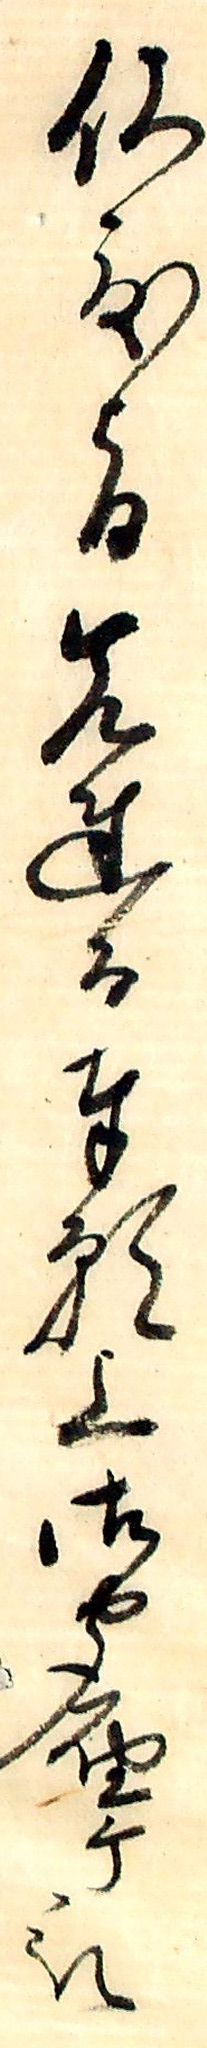仕度旨先達て奉願上御聞届け被
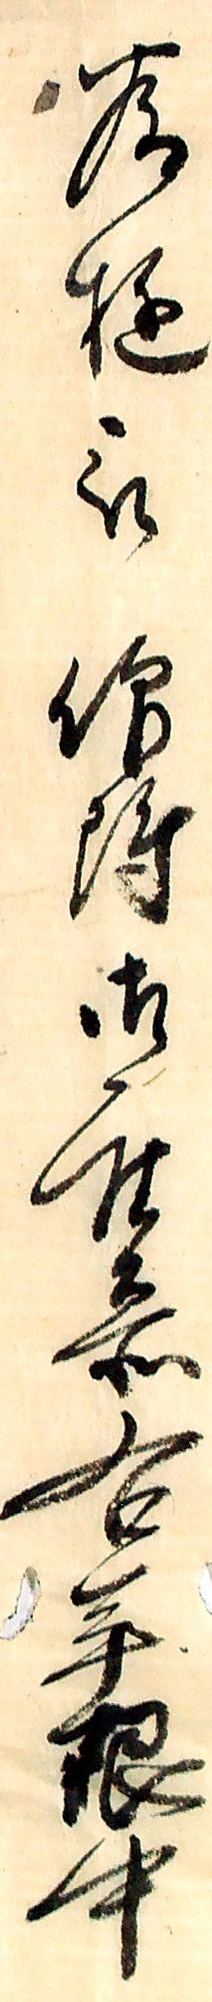為遊被仰附御座候所右年限中
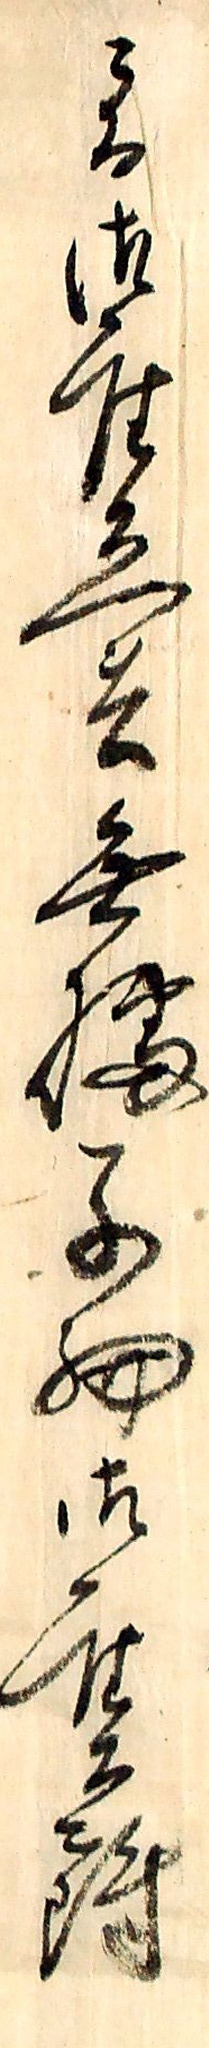にて御座候へ共無拠子細御座候附
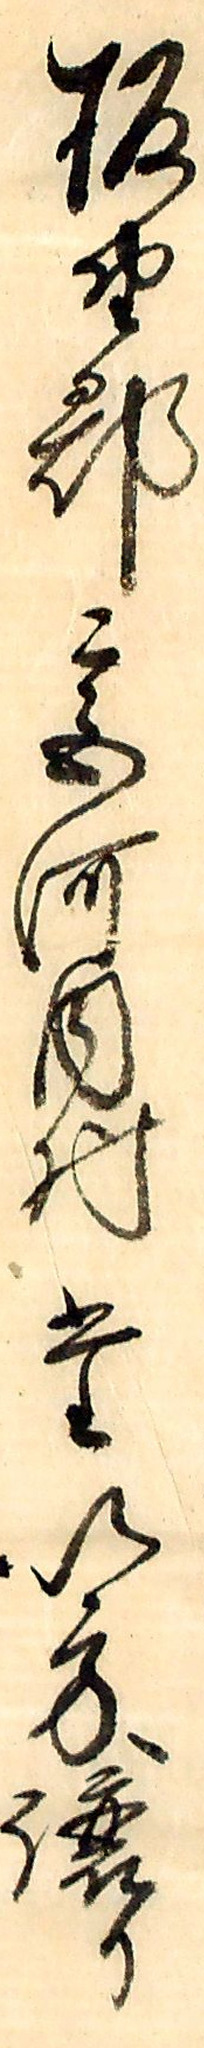板野郡宮河内村たい方へ譲り
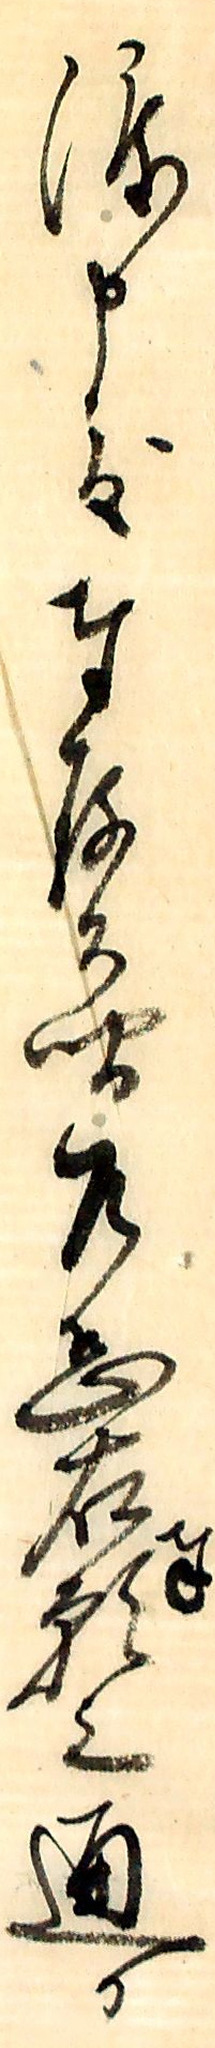渡申度奉存候間乍恐右奉願上通り
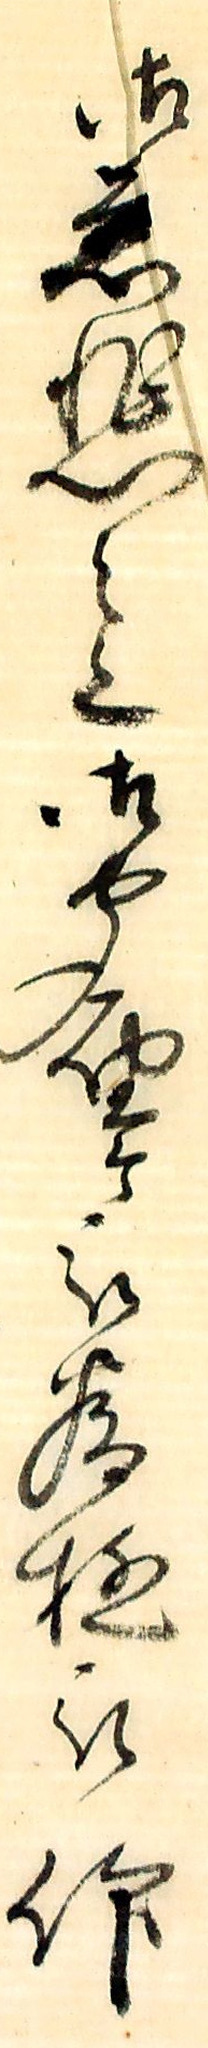御慈悲之上御聞届け被為遊被仰
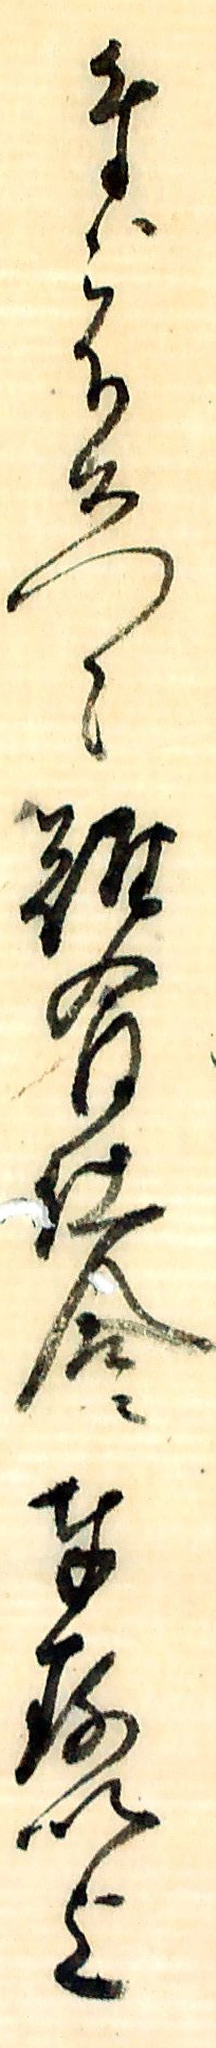付被下候へは難有仕合に奉存候以上
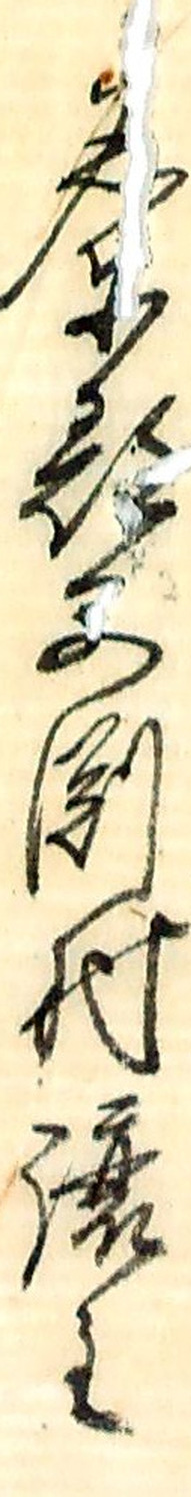名東郡早淵村譲主
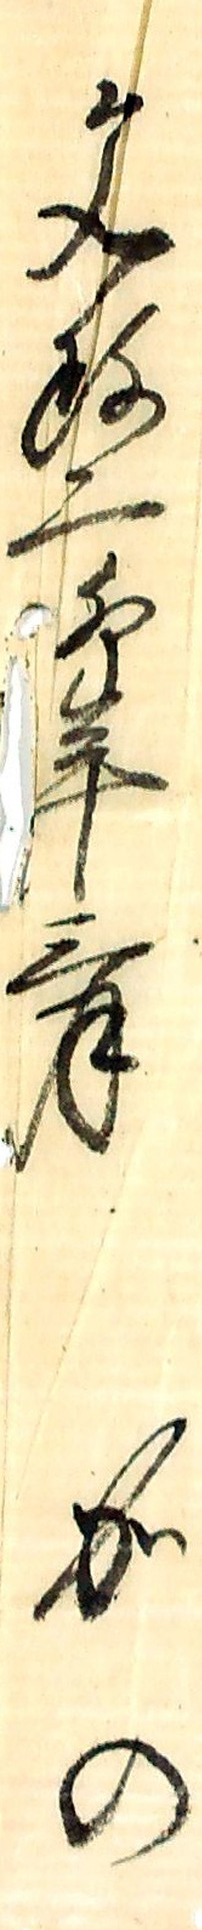文政二卯年三月かの
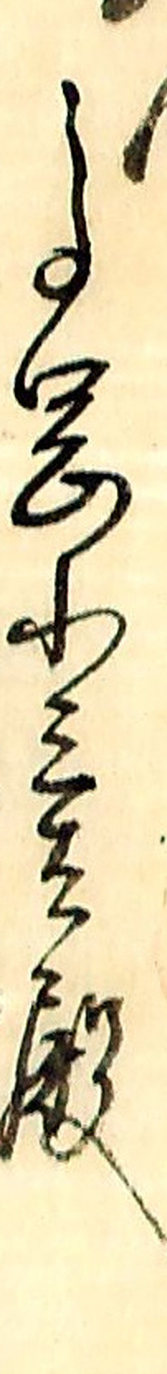高岡小三太殿
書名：諸御願書控(後藤氏壱番）
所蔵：鳴門教育大学 Naruto University of Education
